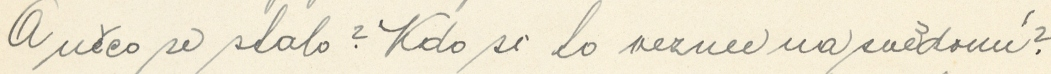A něco se stalo? Kdo si to vezme na svědomí?
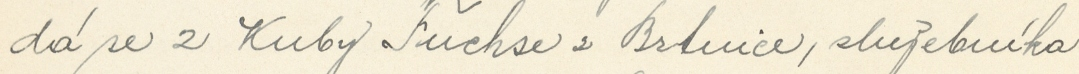dá se z Kuby Fuchse z Brtnice, služebníka
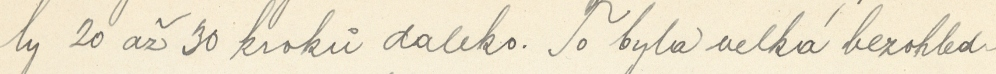ly 20 až 30 kroků daleko. To byla velká bezohled-
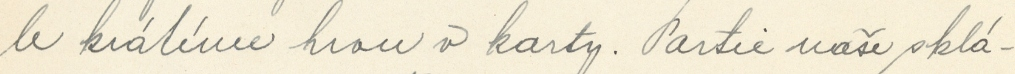le krátíme hrou v karty. Partie naše sklá-
